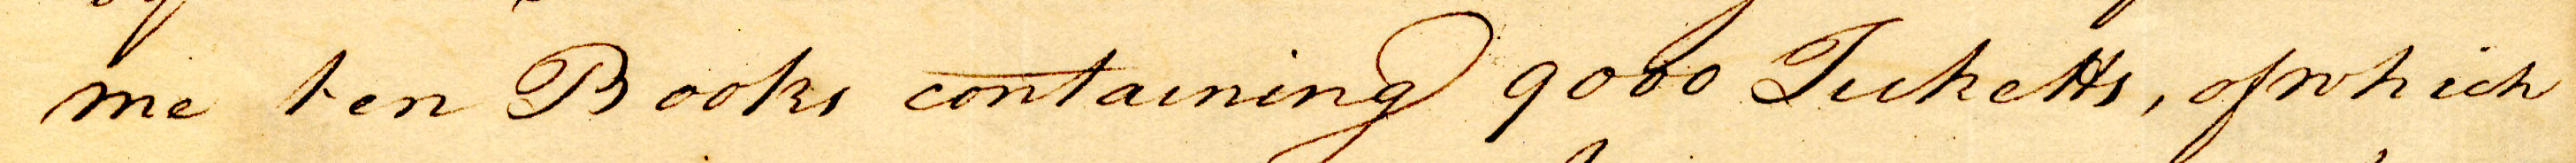me ten Books containing 9000 Tickets, of which
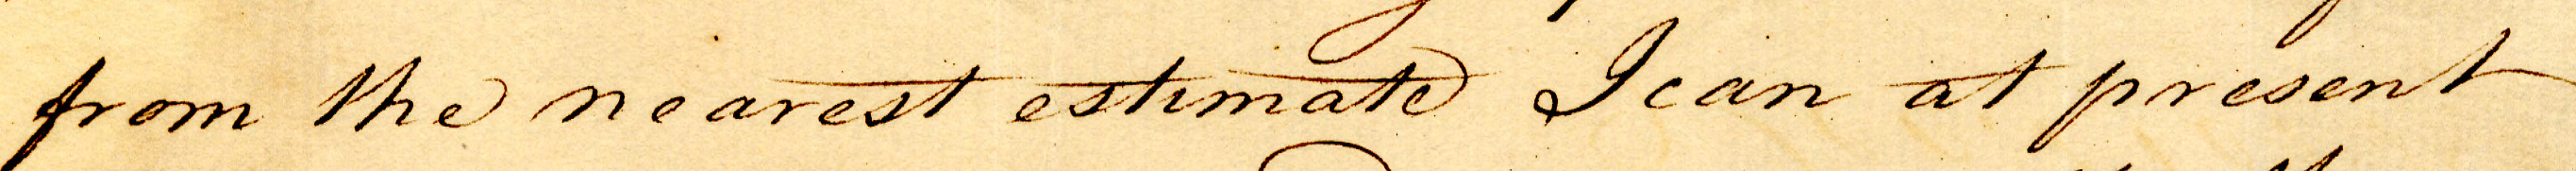from the nearest estimate I can at present
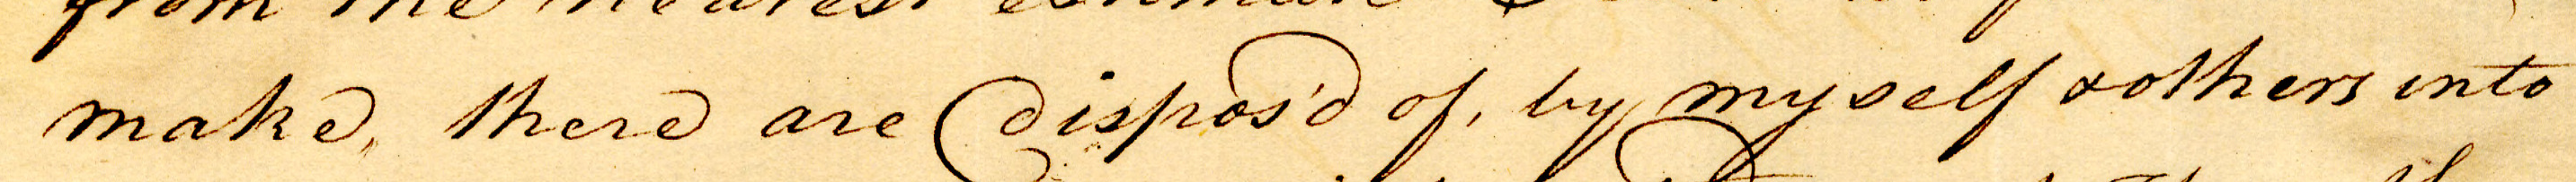make there are dispos'd of, by myself & others into
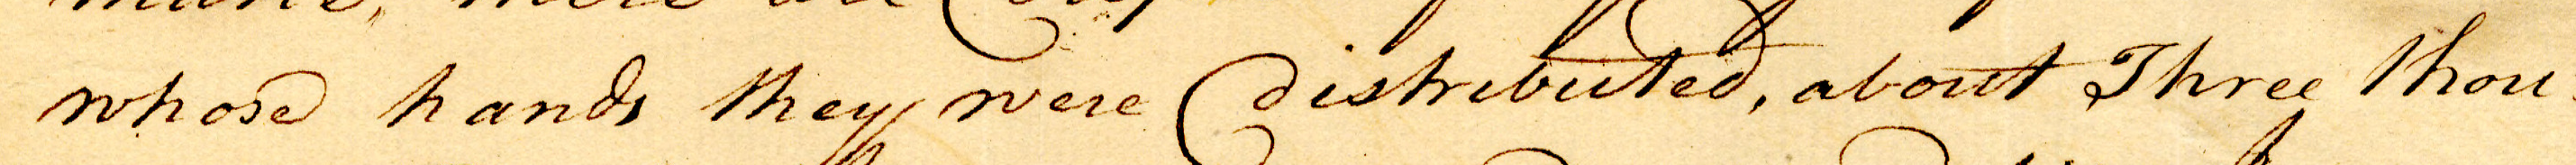whose hands they were distributed about Three thou-
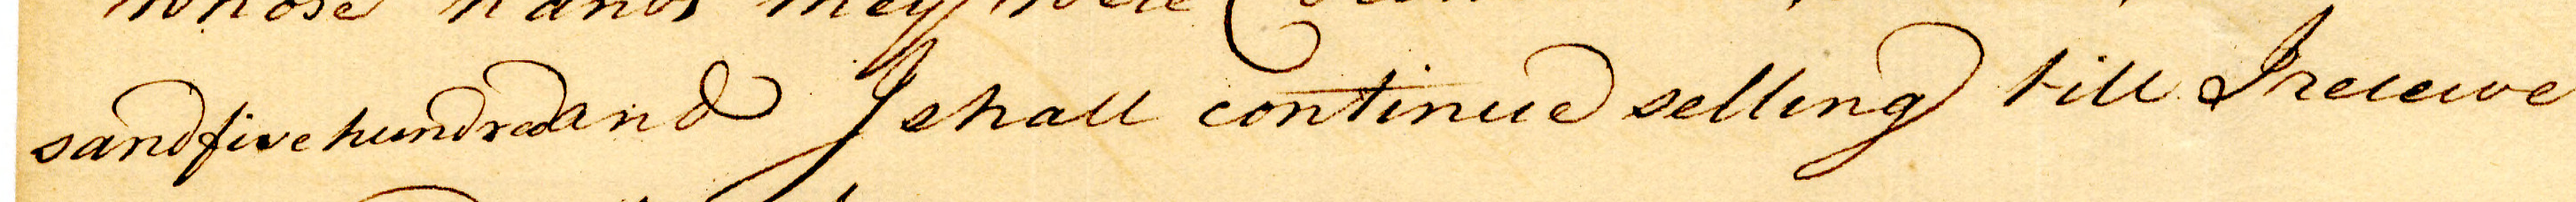sand five hundred and I shall continued selling till I receive
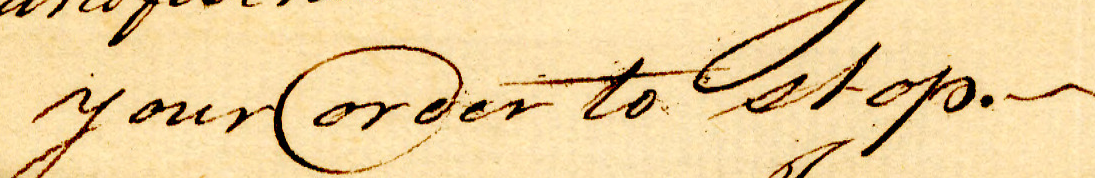your order to stop.
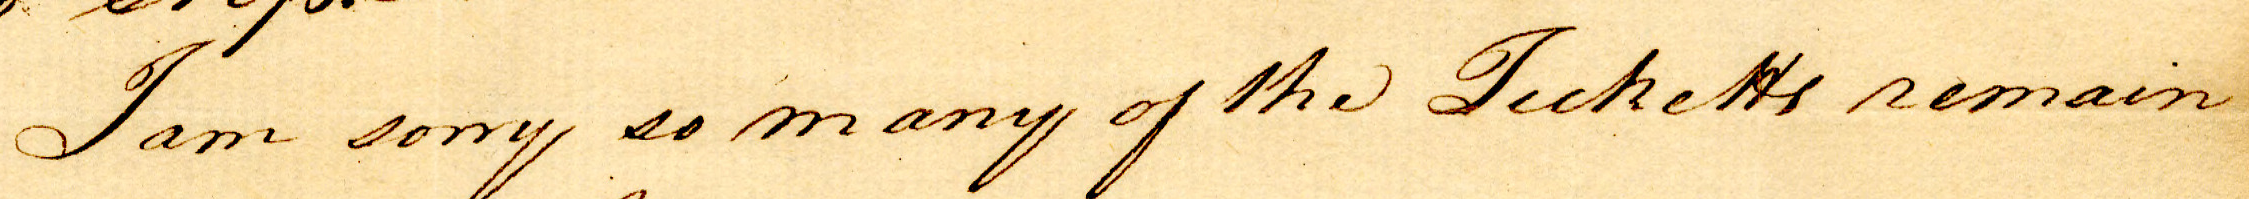I am sorry so many of the Tickets remain
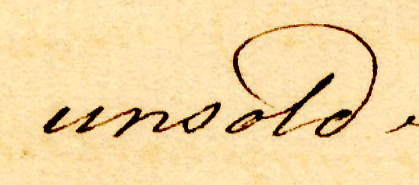unsold.
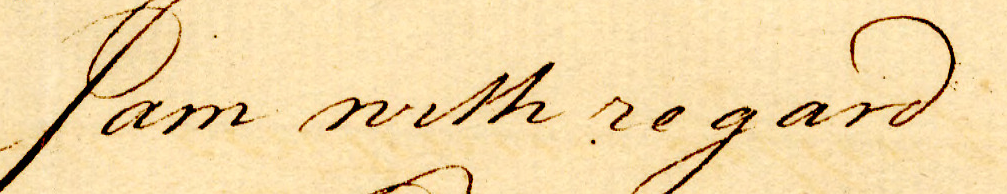I am with regard
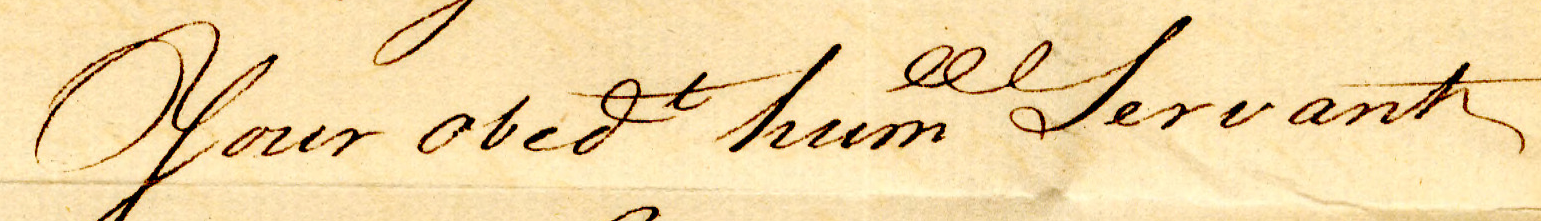Your obed^t hum^ble Servant
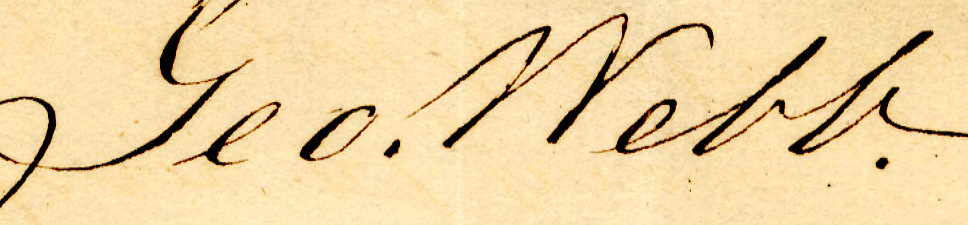Geo. Webb.
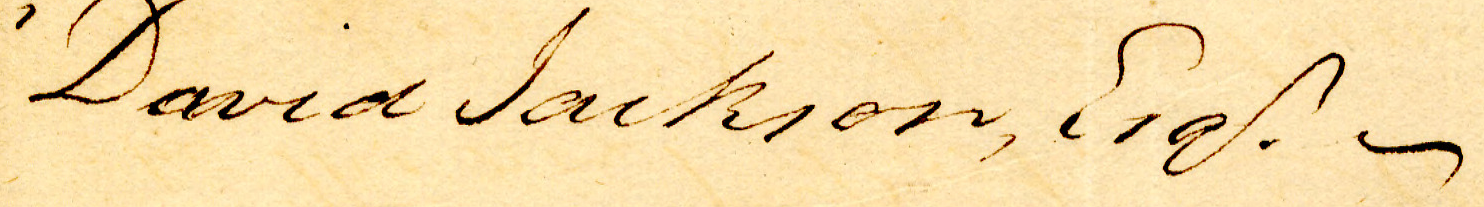David Jackson, Esq^r-
